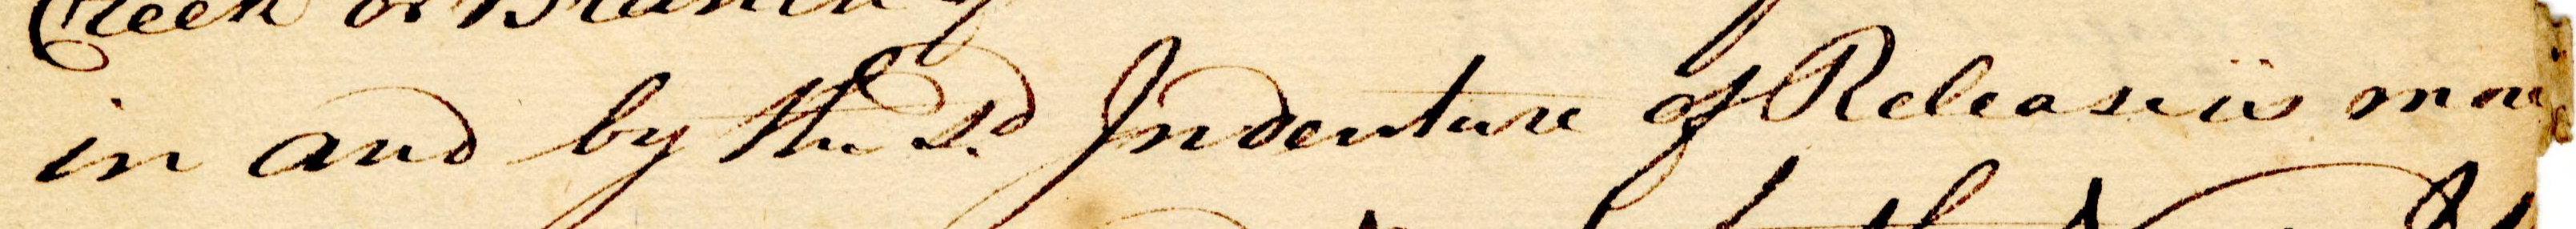in and by the s^d indenture of Release is ma
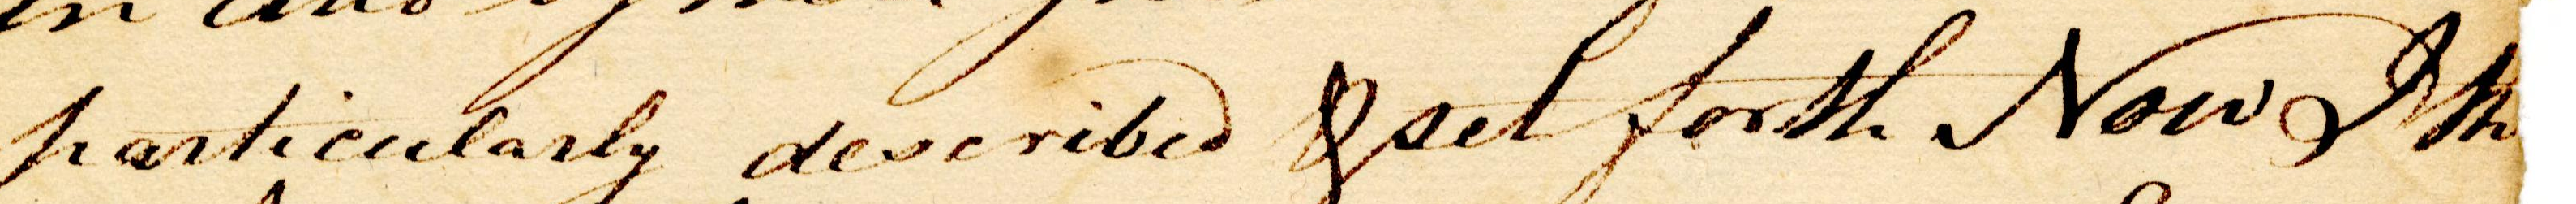particularly described & set forth Now I the
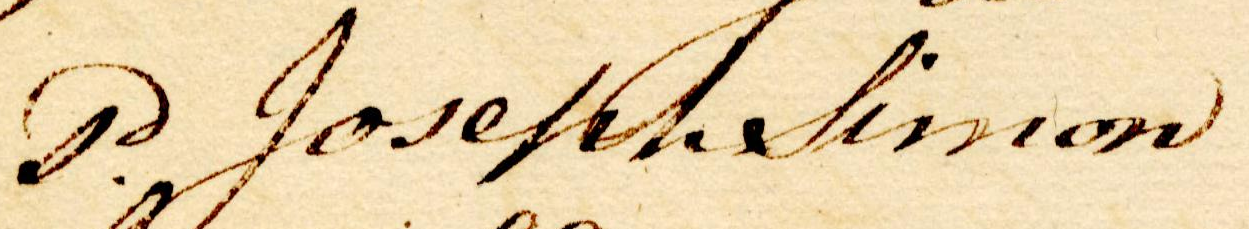s^d Joseph Simon
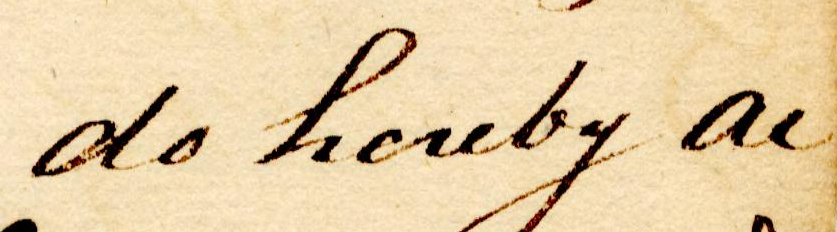do hereby ac
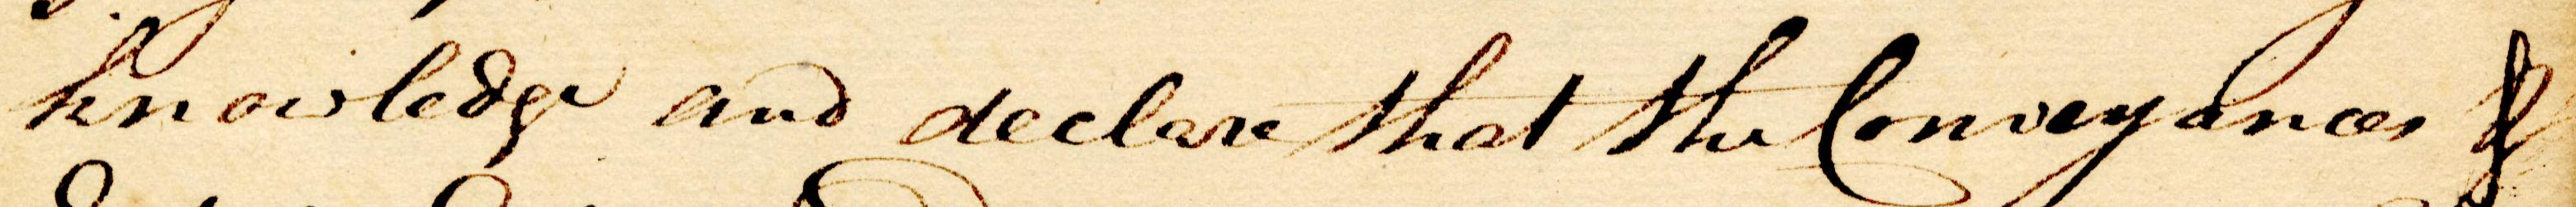knowledge and declare that the Conveyances &
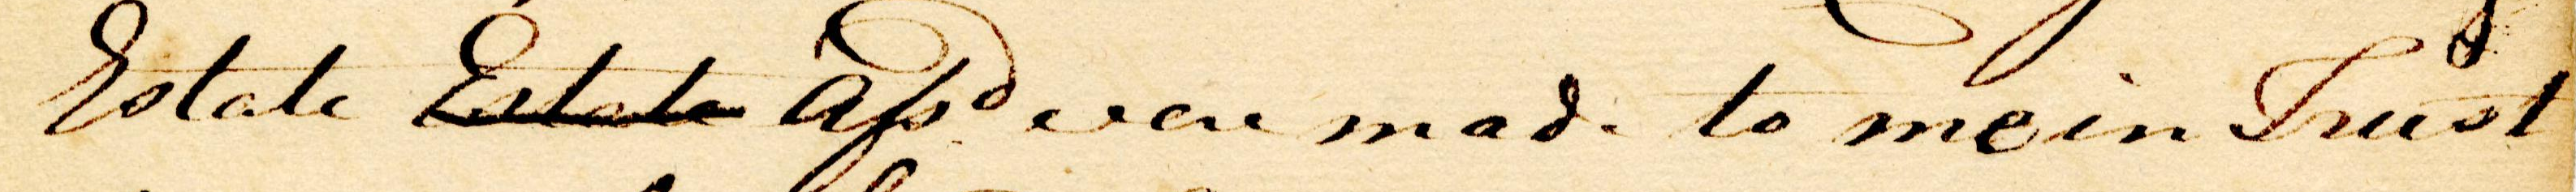Estate [Estate] ass'd was made to me in Trust
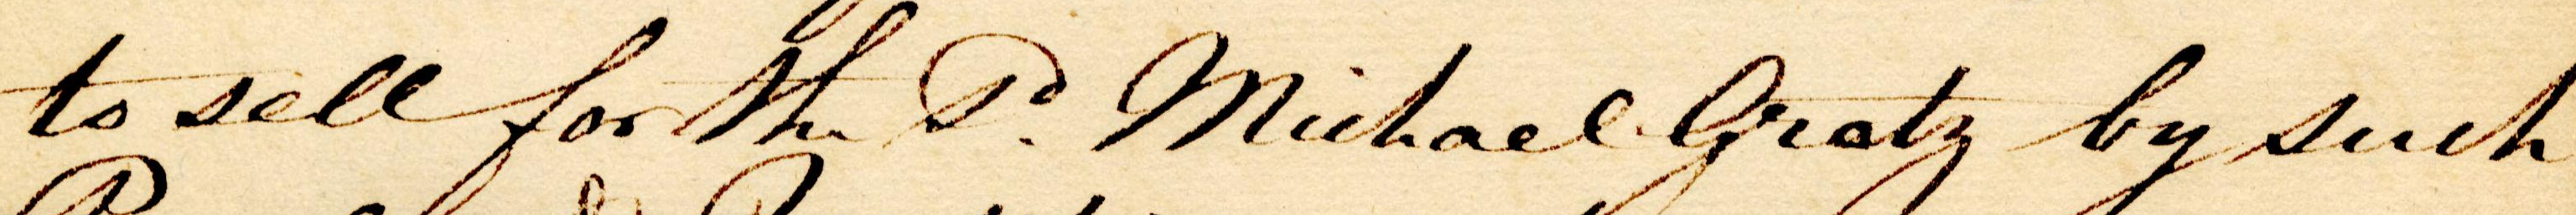to sell for the s^d. Michael Gratz by such
